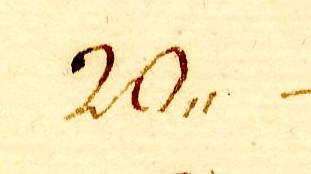20..
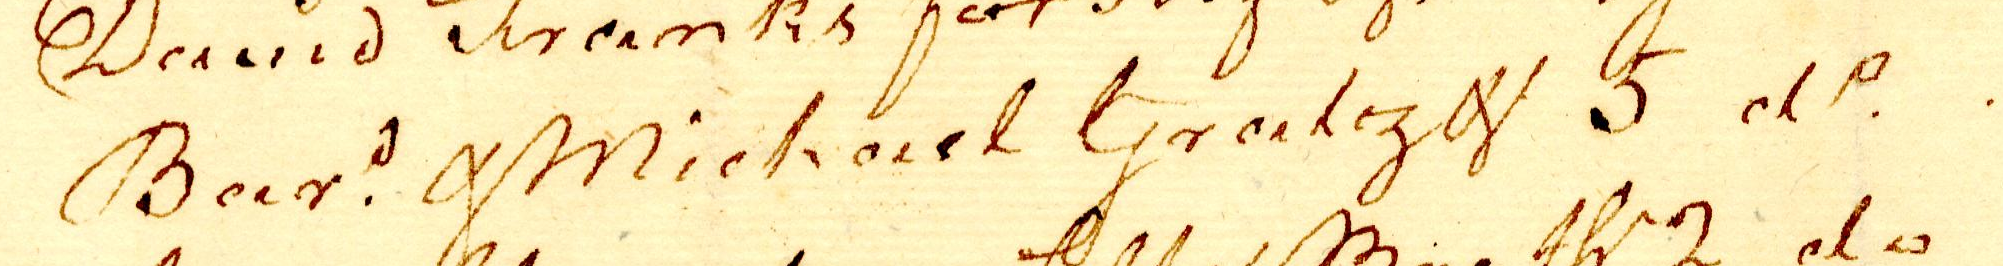Bar^d. & Michael Gradz &^c 5 d^o.
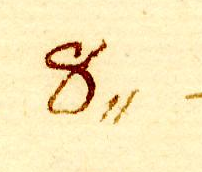8..
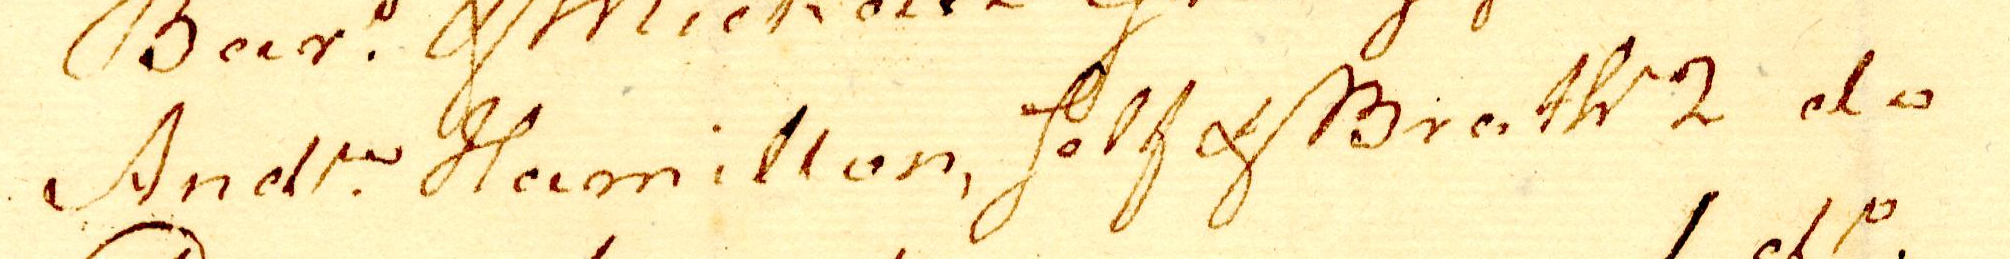And^w. Hamilton self & Broth 2 d^o
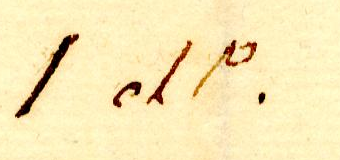1 d^o.
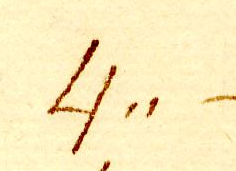4..
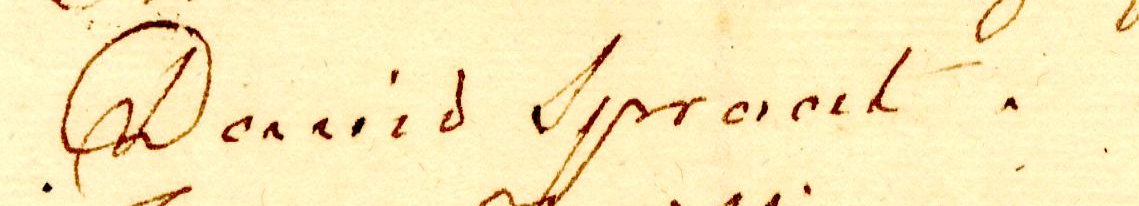David Sproat.
